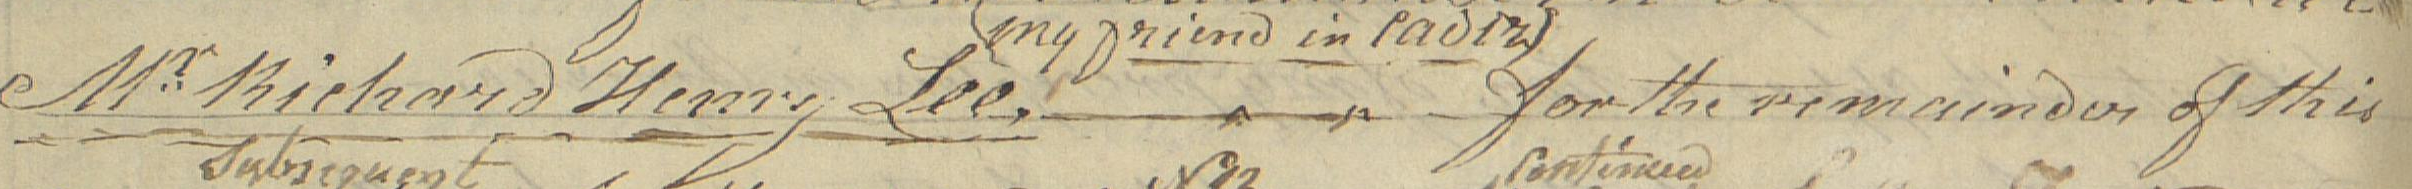M^r. Richard Henry Lee. ^ ^ for the remainder of this
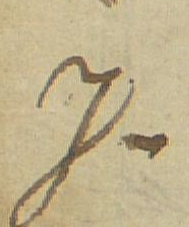J
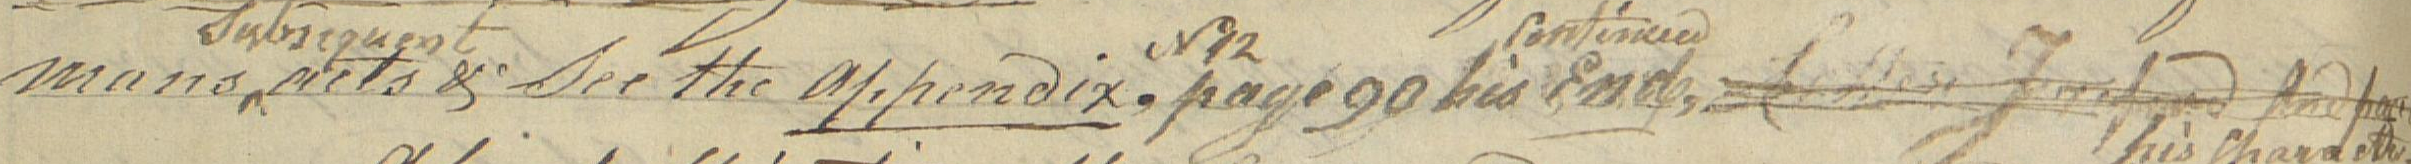mans ^ acts & See the Appendix, page 90 his End Catter Jersey) And park
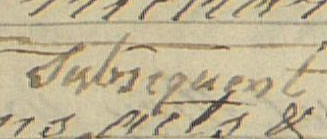Subsequent
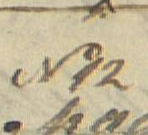N12
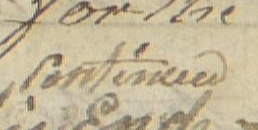Continued
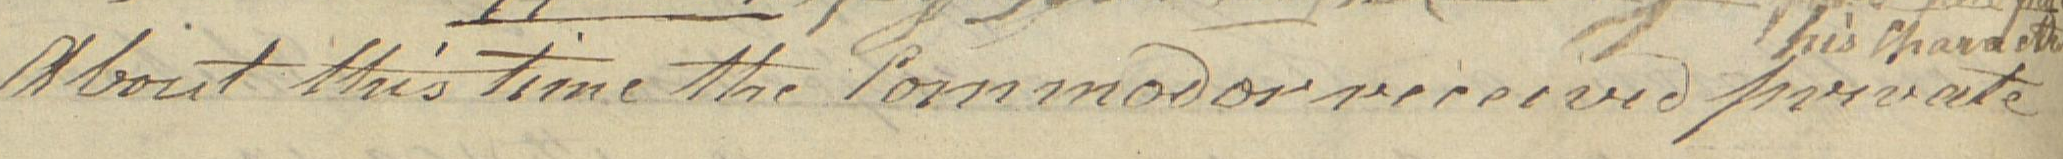About this time the Commodor received private
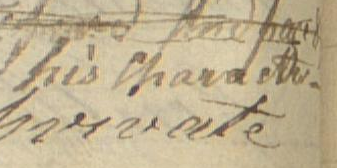his Character
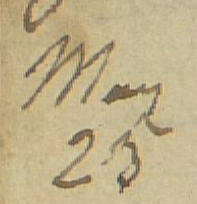May
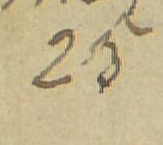23
